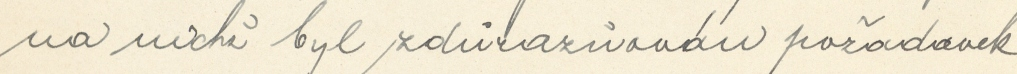na nichž byl zdůrazňován požadavek
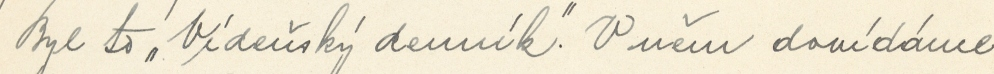Byl to „Vídeňský denník“. V něm dovídáme
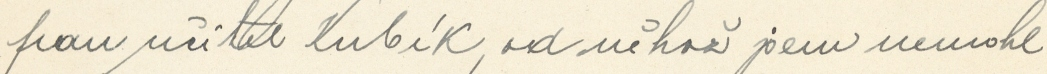pan učitel Kubík, od něhož jsem nemohl
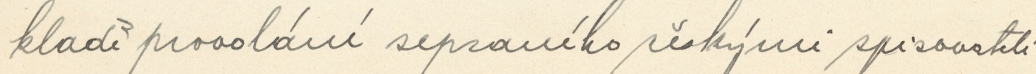kladě provolání sepsaného českými spisovateli
